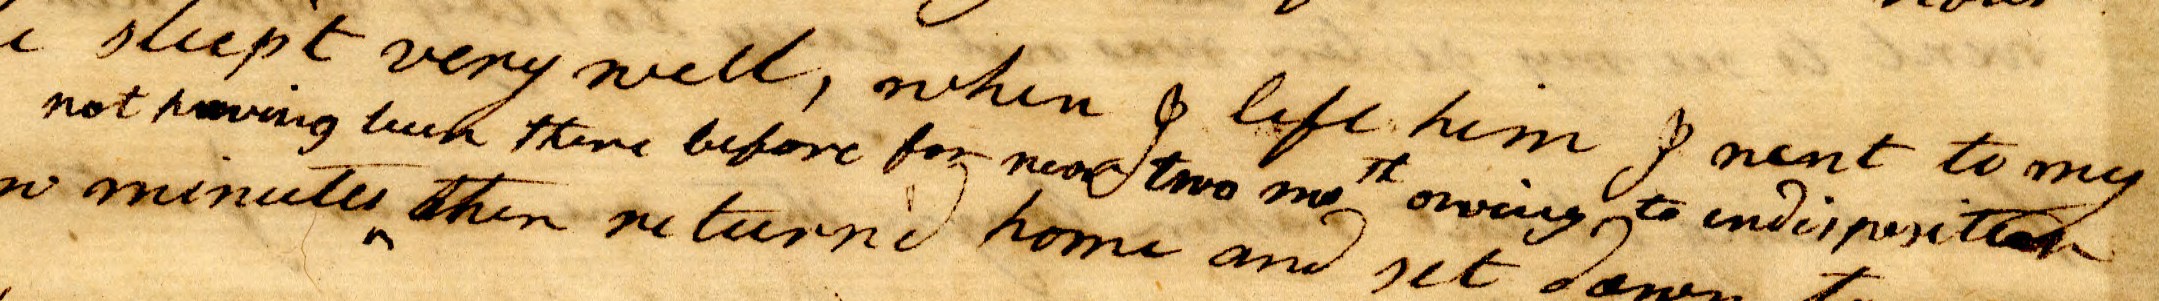not having been there before for near two mo^th owing to indisposition
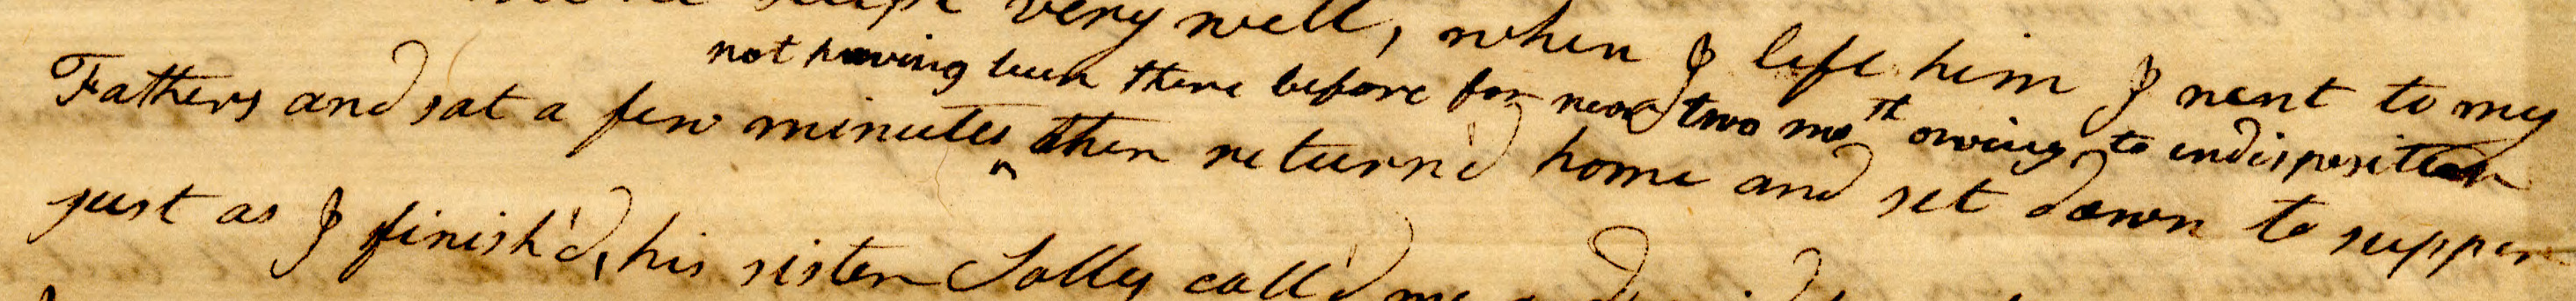Fathers and sat a few minutes ^ then return'd home and set down to supper
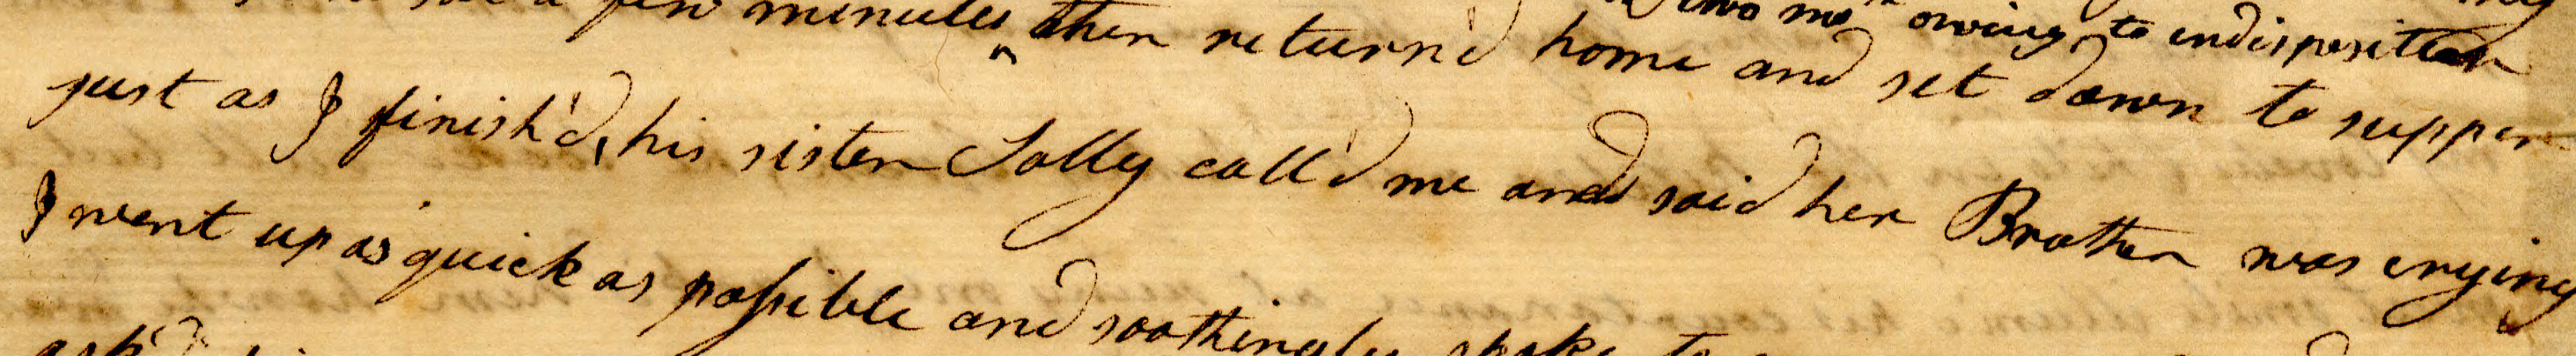just as I finish'd, his sister Sally calld me and said her Brother was crying
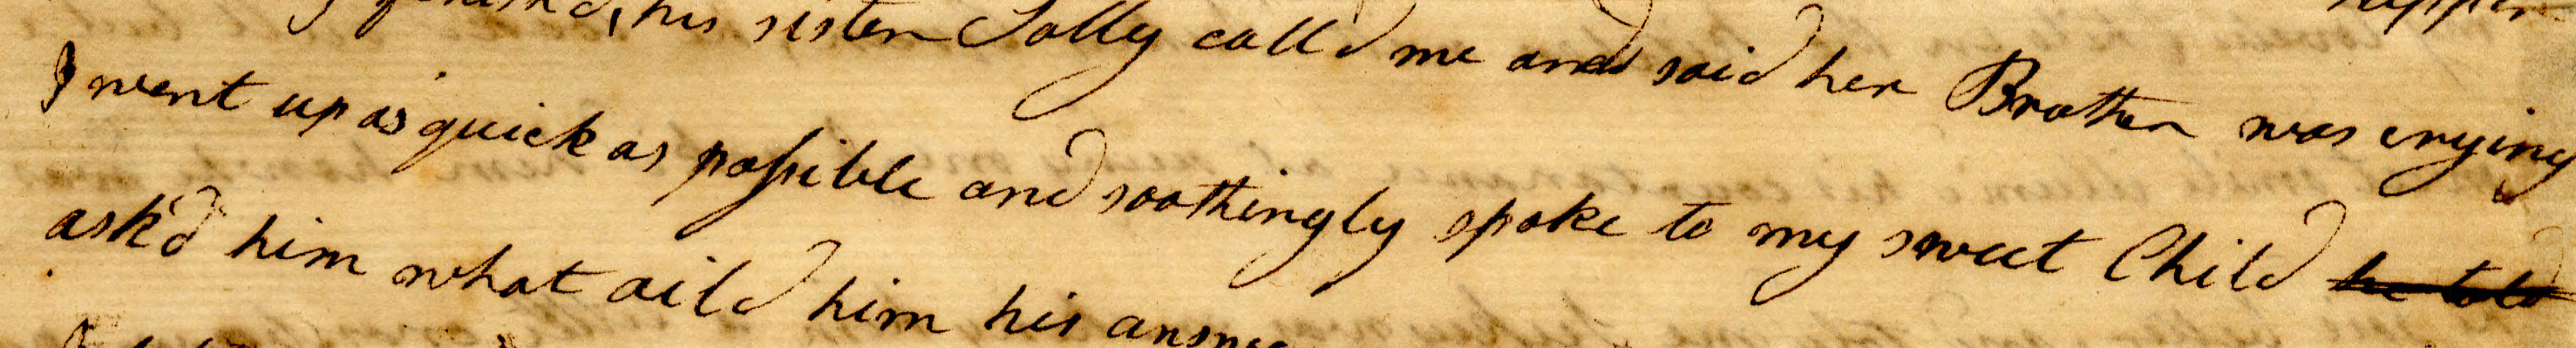I went up as quick as possible and soothingly spoke to my sweet Child [he told]
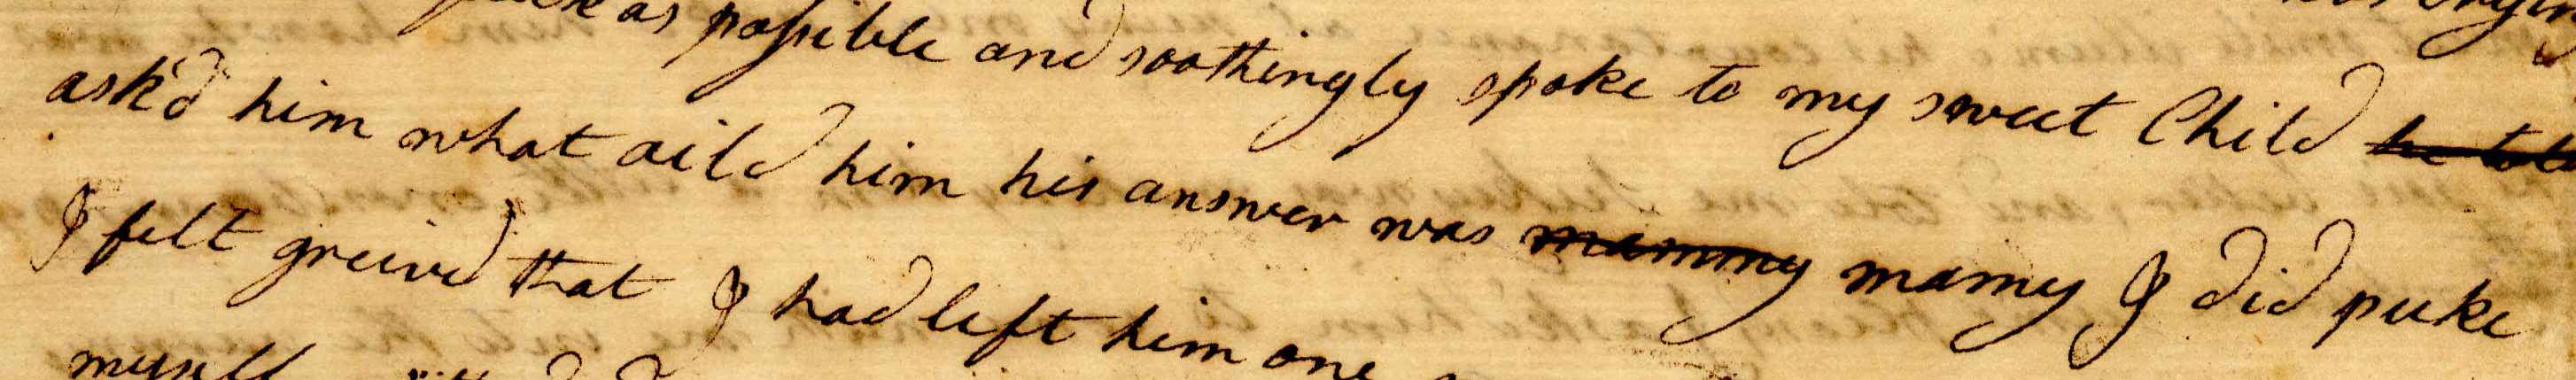ask'd him what aild him his answer was [mammy] mamy I did puke
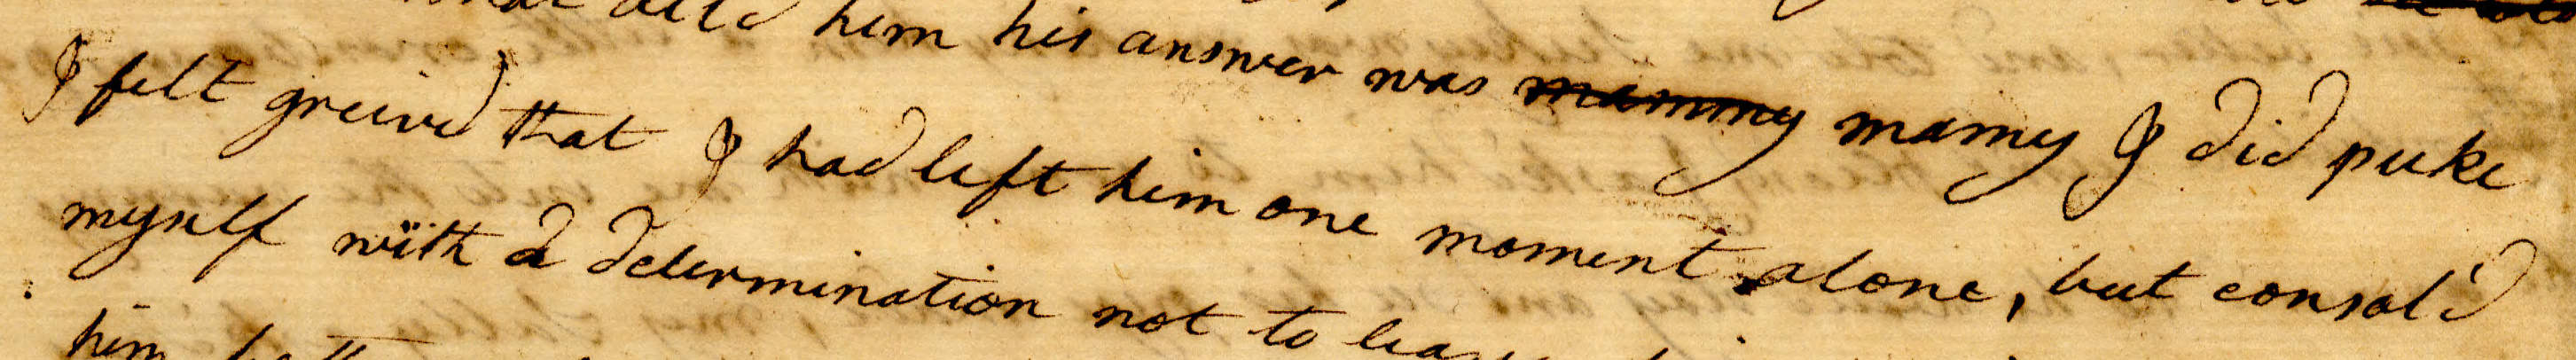I felt greivd that I had left him one moment alone, but consold
